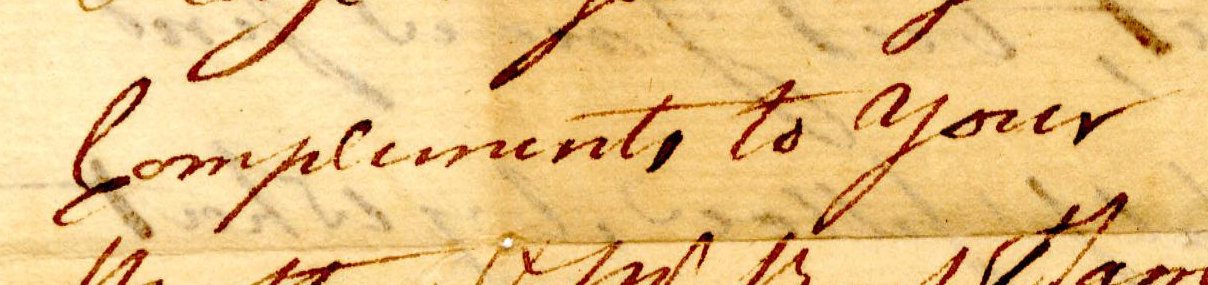Complements to Your
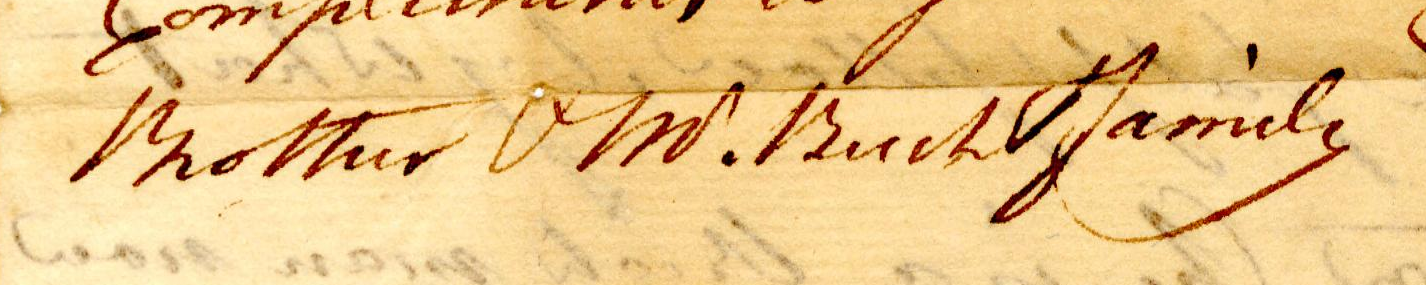Mother & M^r. Birch family
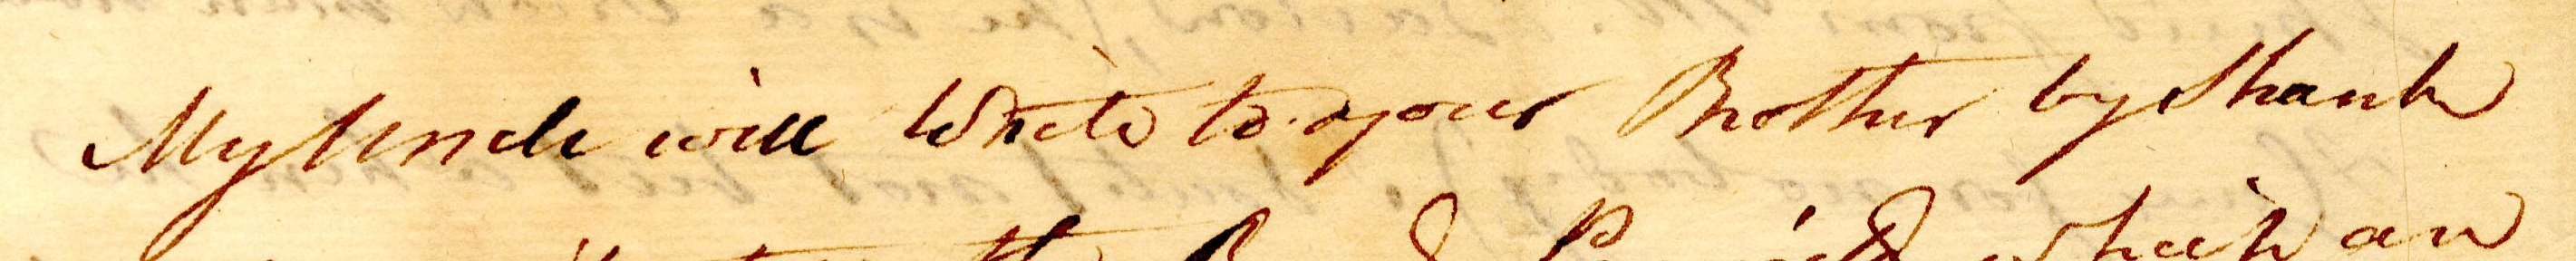My Uncle will wrte to your Brother by Shank
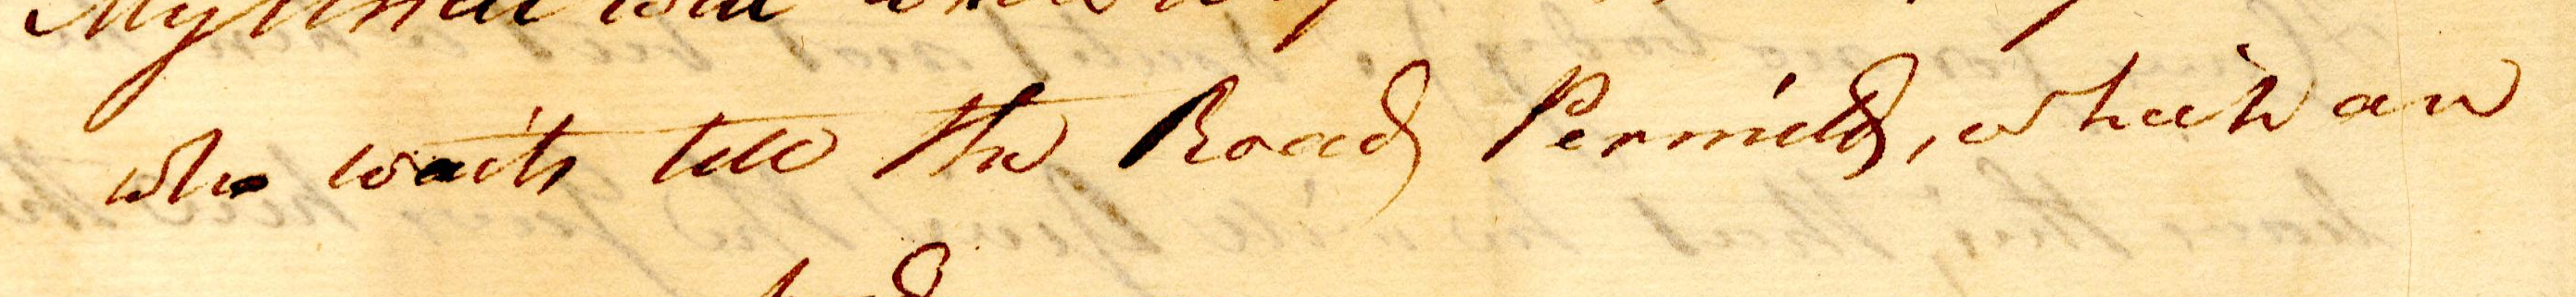also waits told the Road Permits, which are
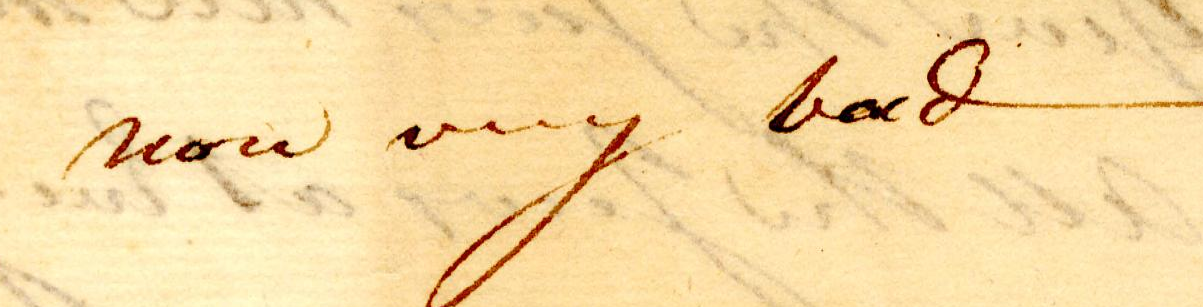now very bad
